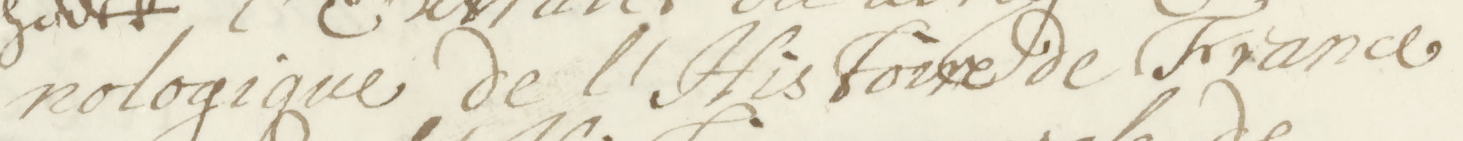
nologique de l'Histoire de France
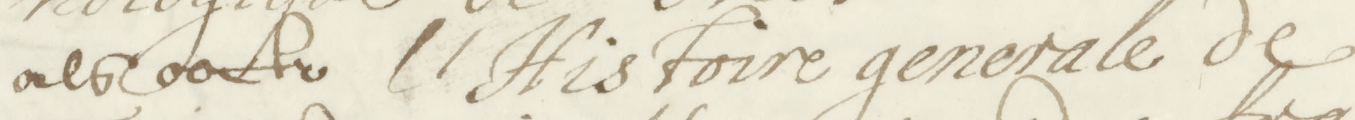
als oock l‛Histoire generale de
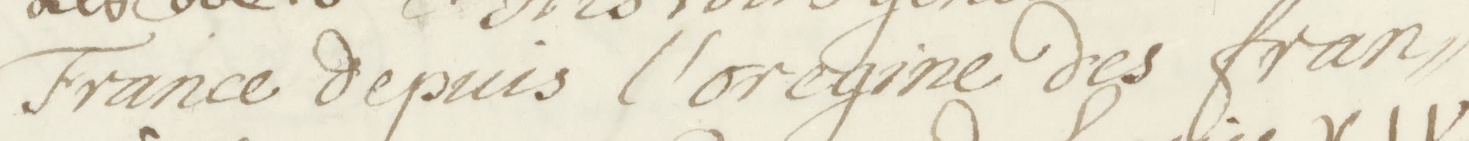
France depuis l‛oregine des fran„
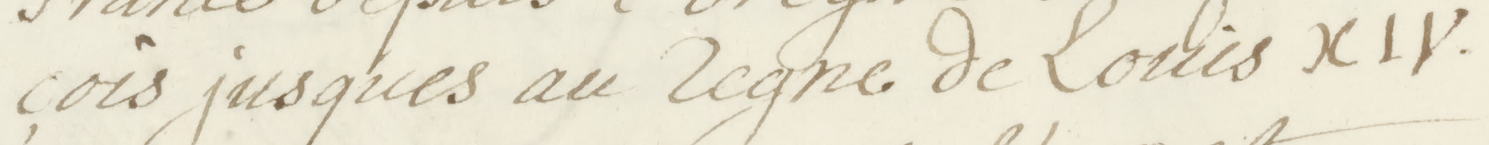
çois jusques au regne de Louis XIV.
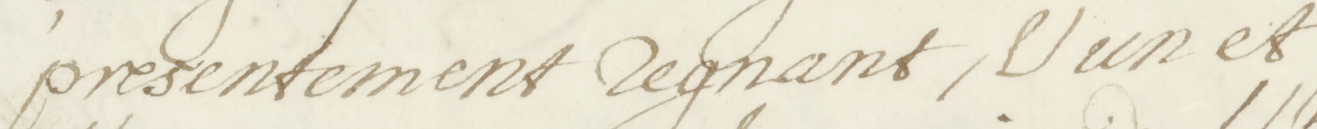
presentement regnant, l‛un et
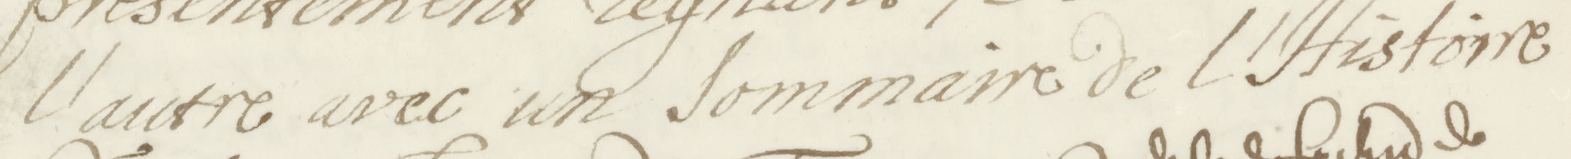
l‛autre avec un Sommaire de l‛Histoire
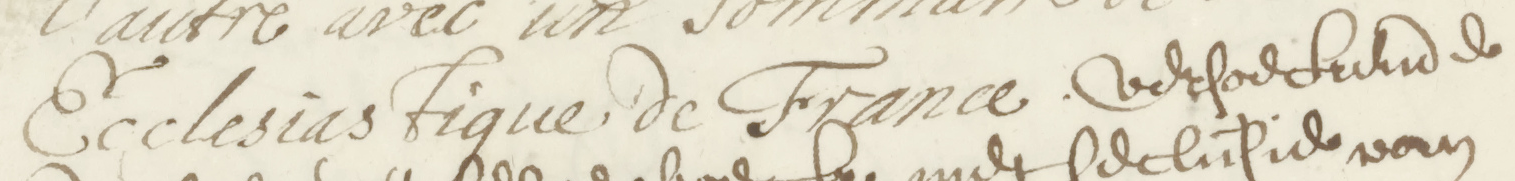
Ecclesiastique de France, versoeckende
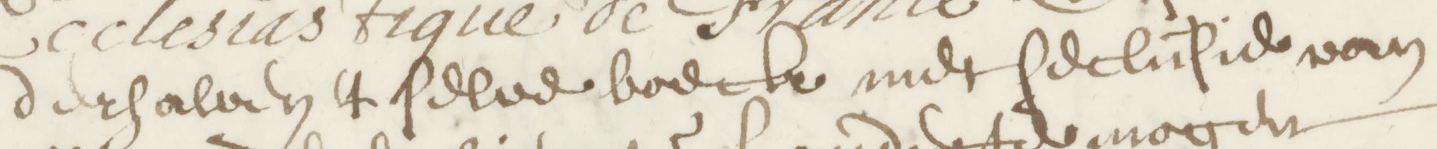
derhalven 't selve boeck met seclusie van
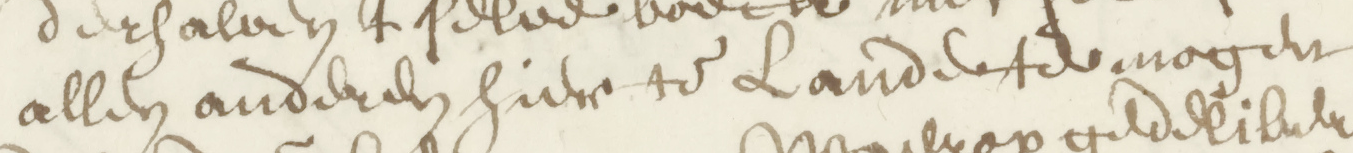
allen anderen hier te Lande te mogen
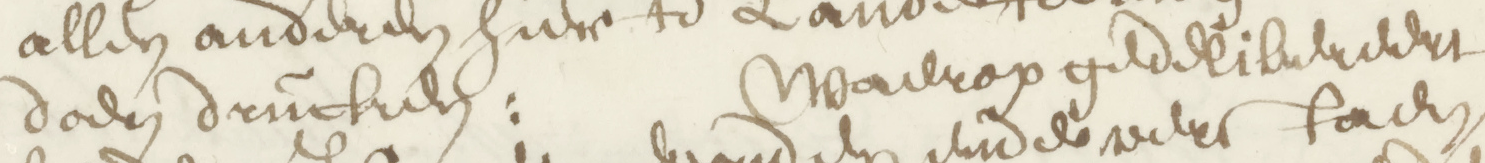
doen drucken: Waerop gedelibereert
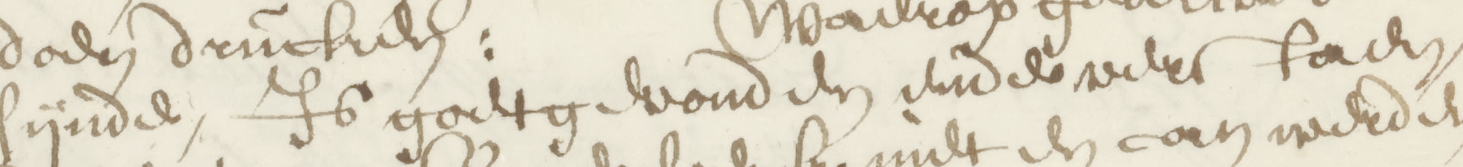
sijnde, Is goetgevonden ende verstaen,
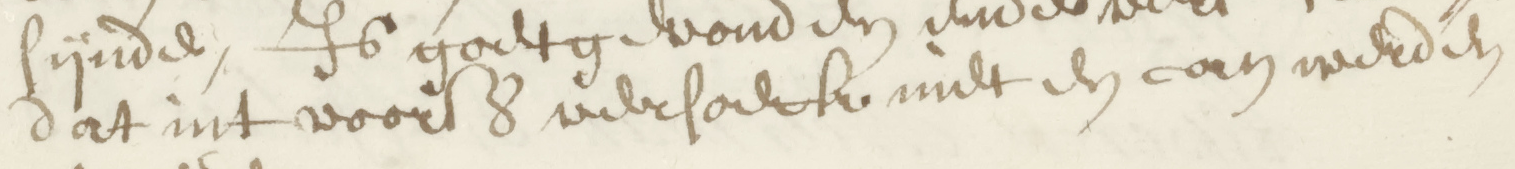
dat int voors versoeck niet en can werden
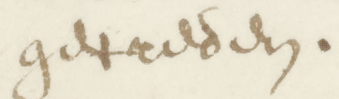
getreden.
